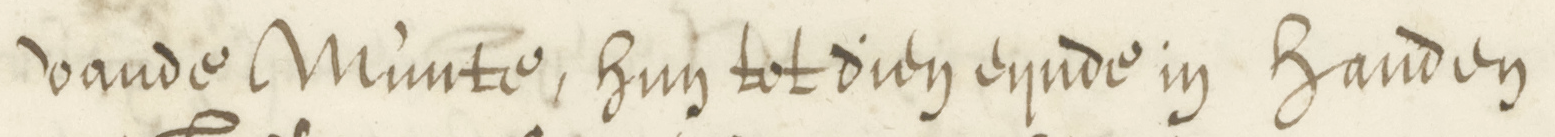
vande Munte, hun tot dien eynde in handen
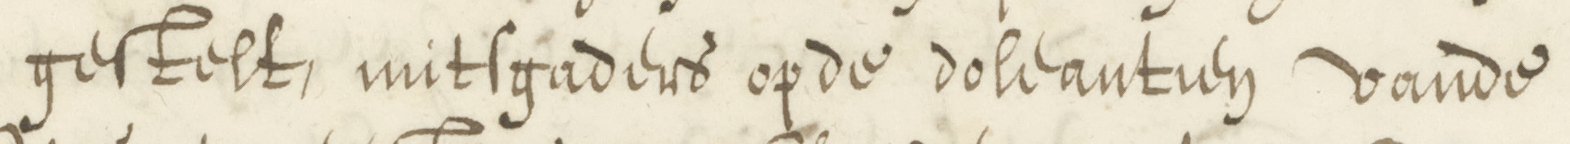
gestelt, mitsgaders opde doleantien vande
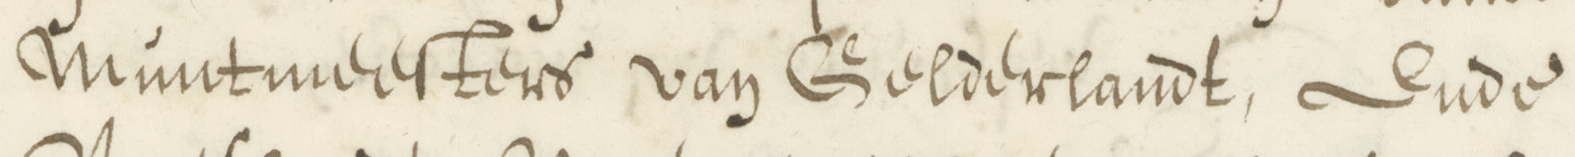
Muntmeesters van Gelderlandt, Ende
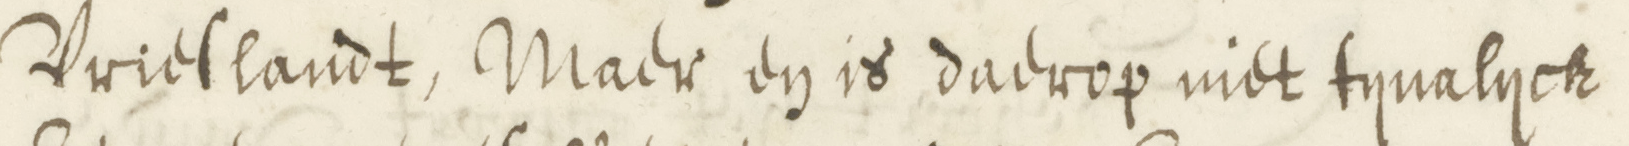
Vrieslandt, Maer en is daerop niet fynalyck
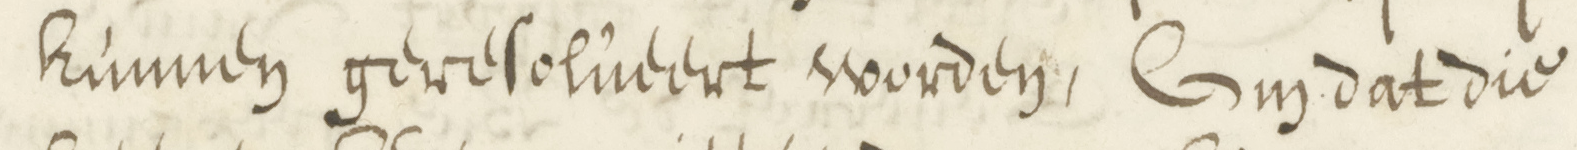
kunnen geresolueert worden, Om dat die
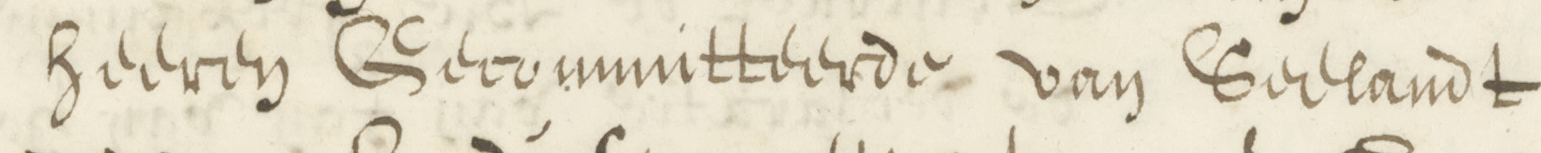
heeren Gecommitteerde van Seelandt
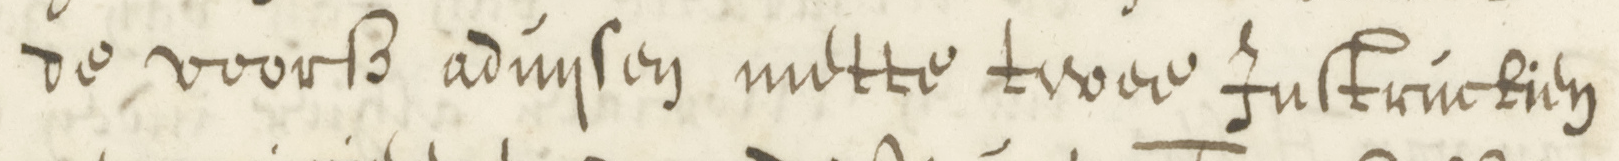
de voors aduysen mette twee Instructien
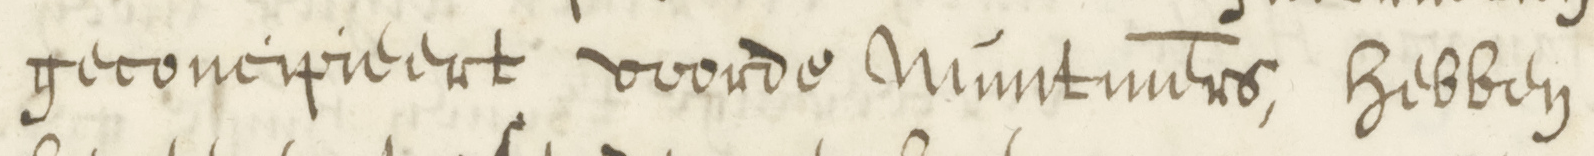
geconcipieert voorde Muntmers, hebben
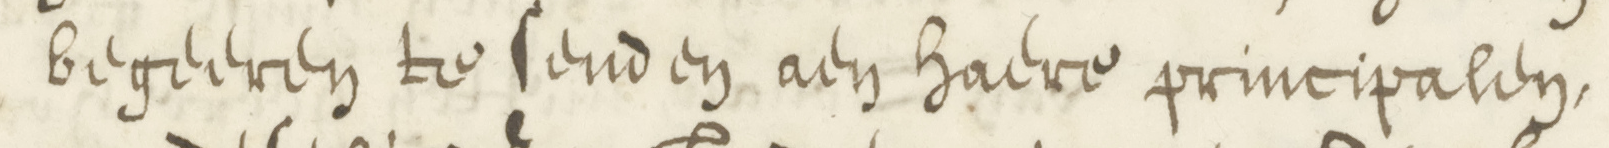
begeeren te senden aen haere principalen,
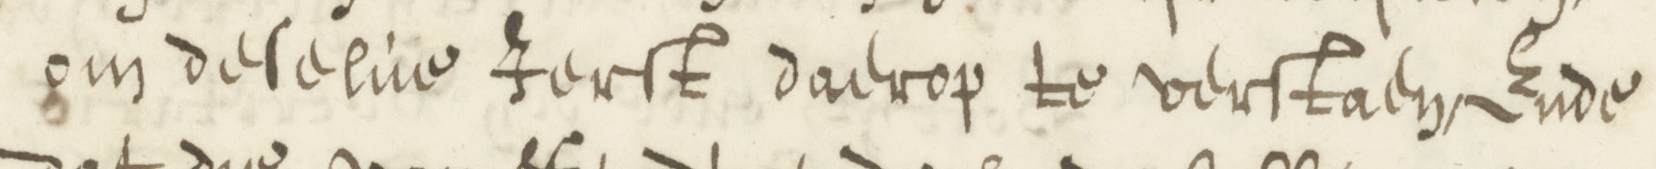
om deselue Ierst daerop te verstaen, Ende
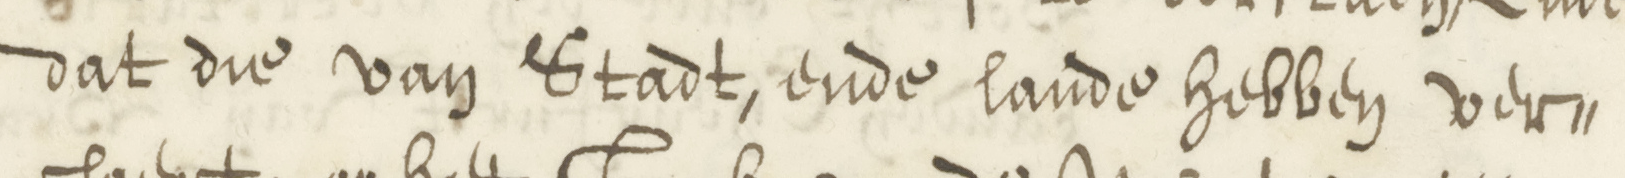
dat die van Stadt, ende lande hebben ver„
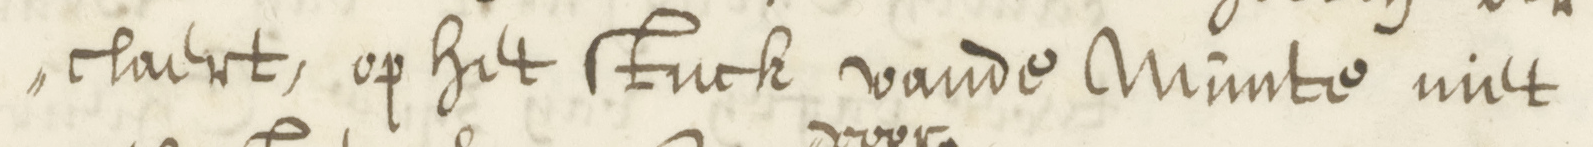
„claert, op het stuck vande Munte niet
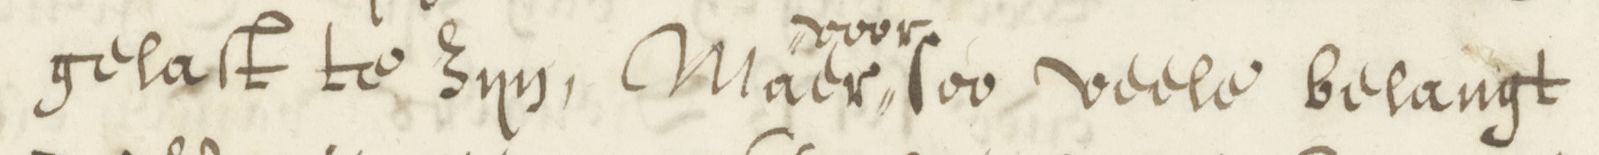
gelast te zyn, Maer„voor soo veele belangt
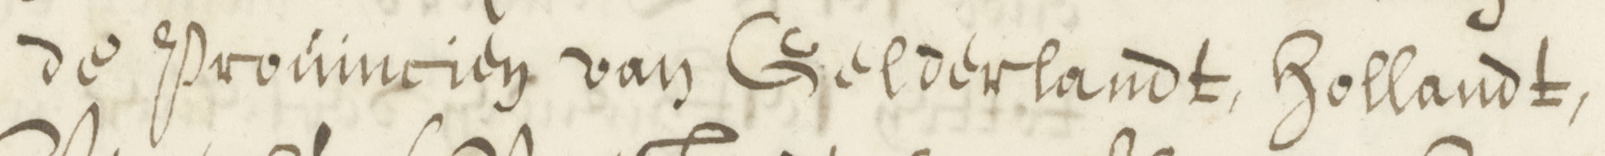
de Prouincien van Gelderlandt, Hollandt,
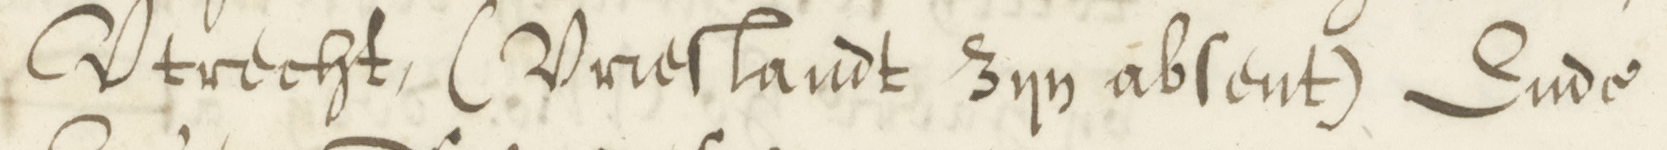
Vtrecht, (Vrieslandt zyn absent) Ende
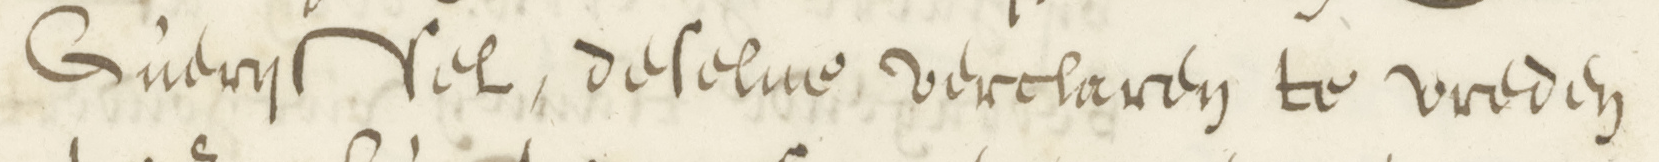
Oueryssel, deselue verclaren te vreden
